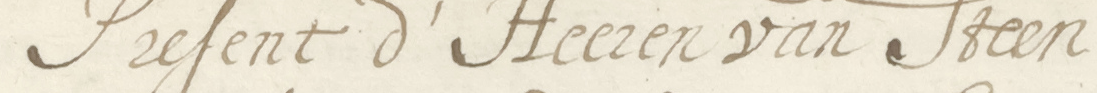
Present d'Heeren van Steen,
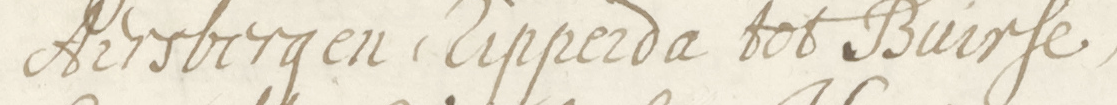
Aersbergen, Ripperda tot Buirse,
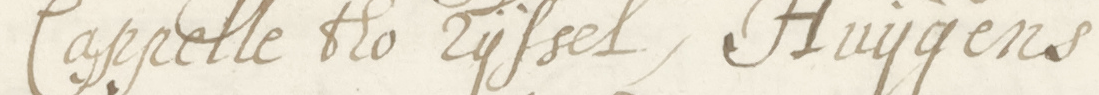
Cappelle tho rijssel, Huijgens,
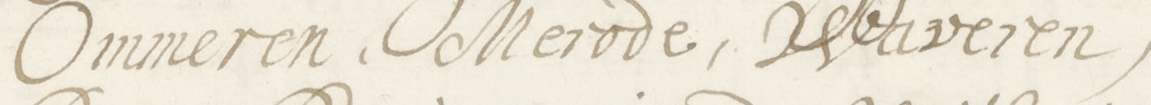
Ommeren, Merode, Waveren,
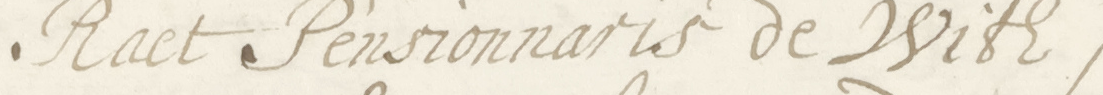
Raet Pensionnaris de With,
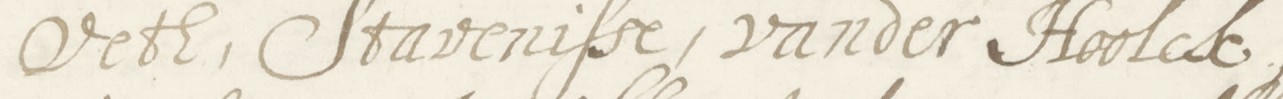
Veth, Stavenisse, van der Hoolck,
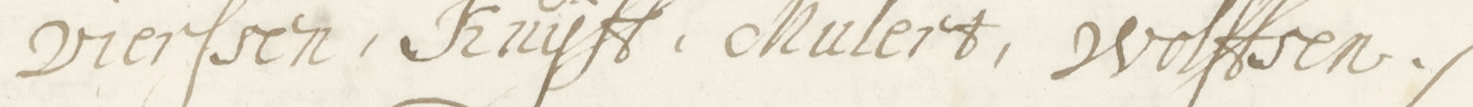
Vierssen, Knijff, Mulert, Wolffsen.
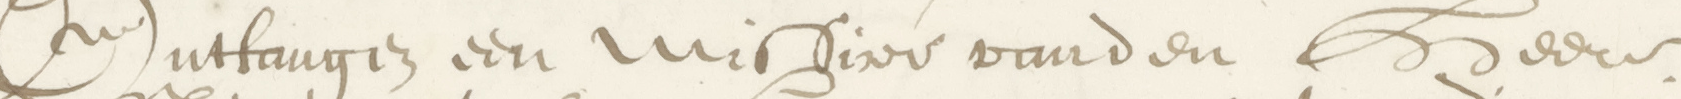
Ontfangen een Missive vanden Heere
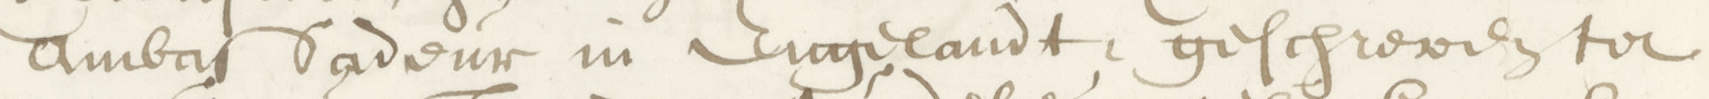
Ambassadeur in Engelandt, geschreven tot
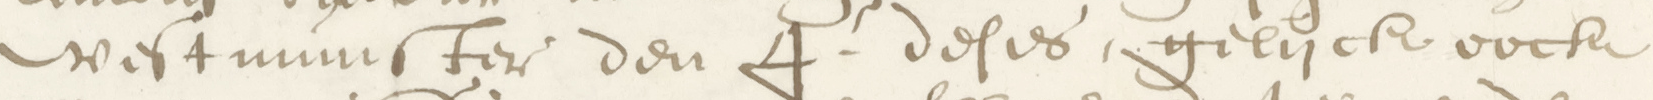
Westmunster den 4e. deses, gelijck oock
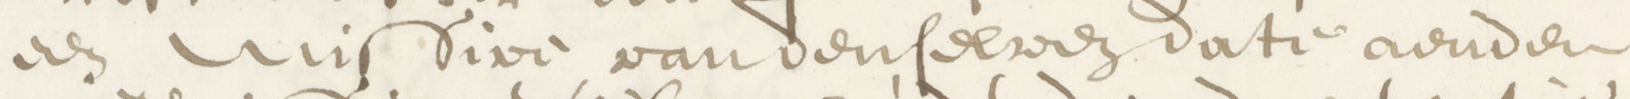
een Missive van denselven, date aenden
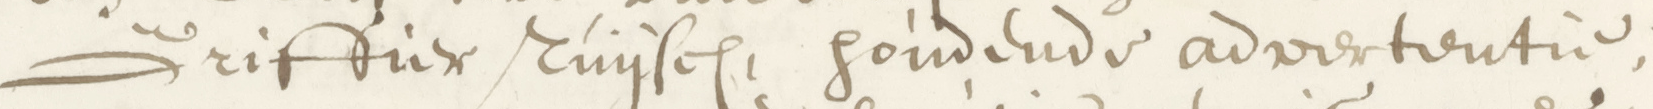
Griffier Ruijsch, houdende advertentie;
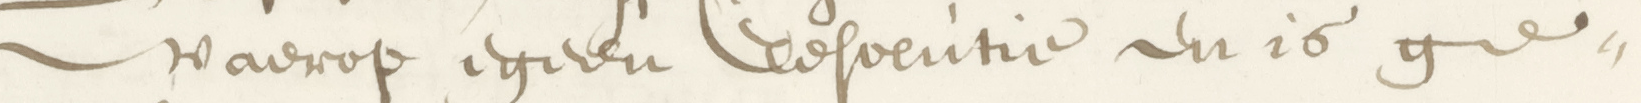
Waerop egeen Resolutie en is ge,,
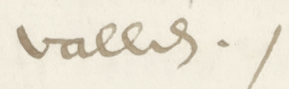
vallen.
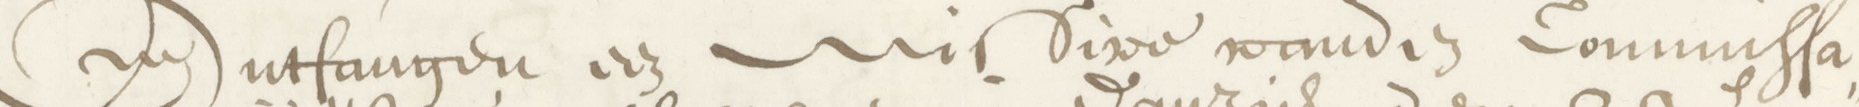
Ontfangen een Missive vanden Commissa„
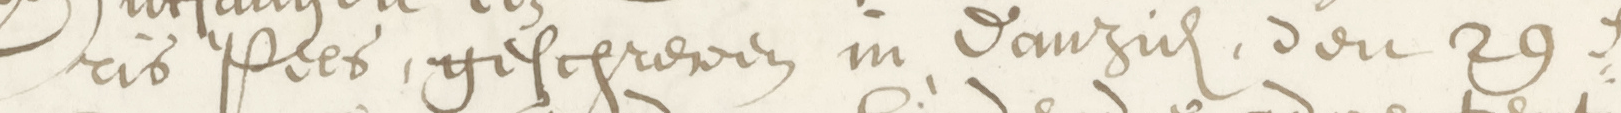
ris Pels, geschreven in Danzich, den 29en.
